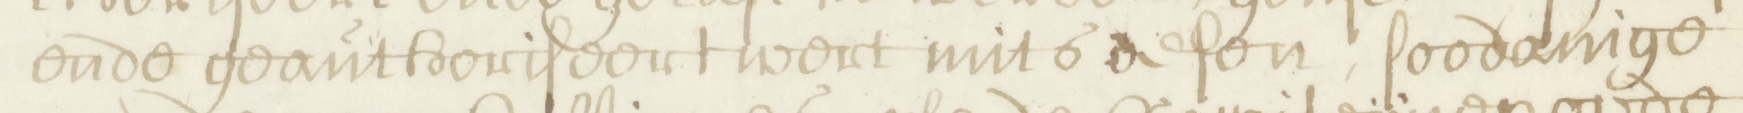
ende geauthoriseert wert mits desen, soodanige
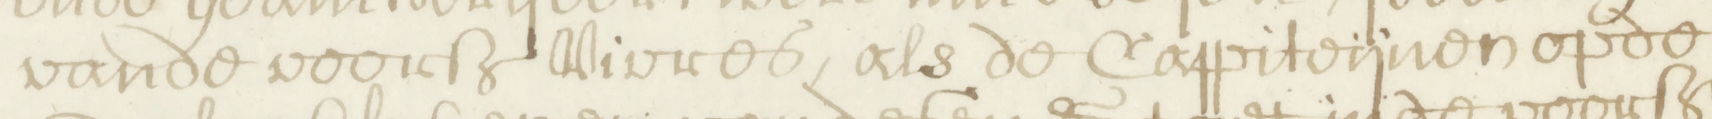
vande voors Vivres, als de Cappiteijnen opde
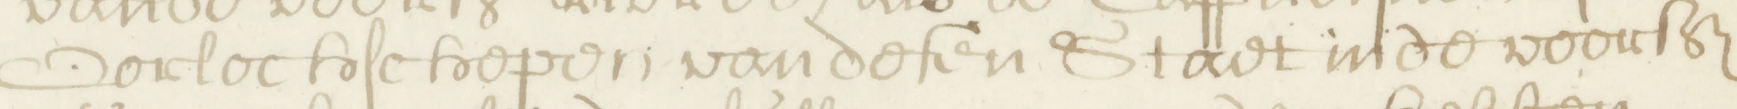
Oorlochschepen van desen Staet inde voors
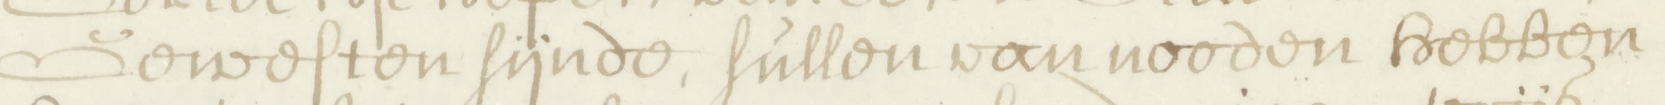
Gewesten sijnde, sullen van nooden hebben
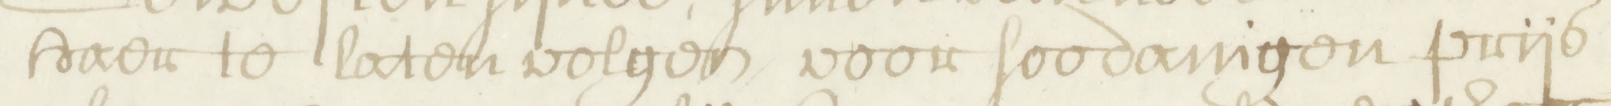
haer te laten volgen, voor soodanigen prijs
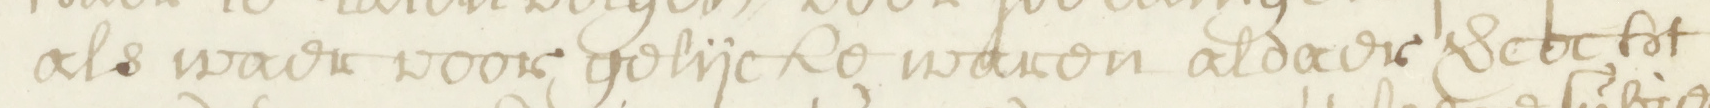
als waer voor gelijcke waren aldaer vcocht
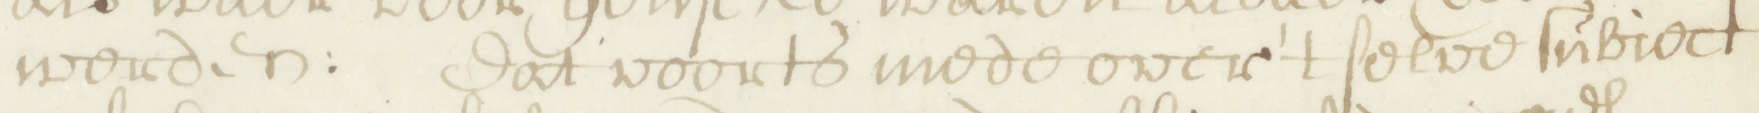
werden: Dat voorts mede over 't selve subiect
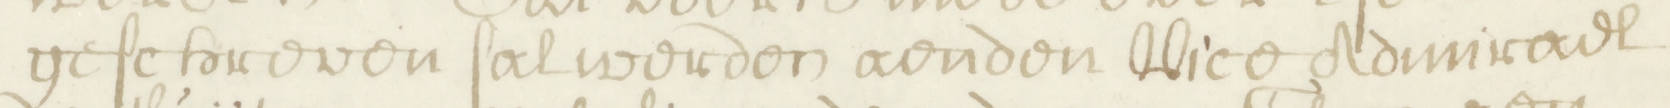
geschreven sal werden aenden Vice Admirael
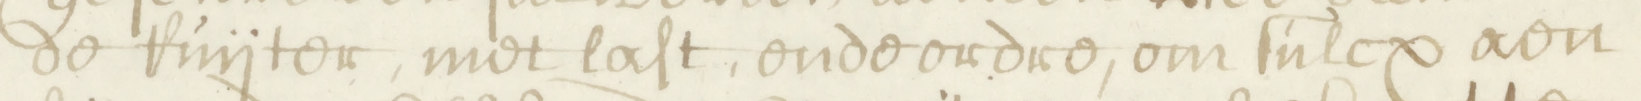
de Ruijter, met last, ende ordre, om sulcx aen
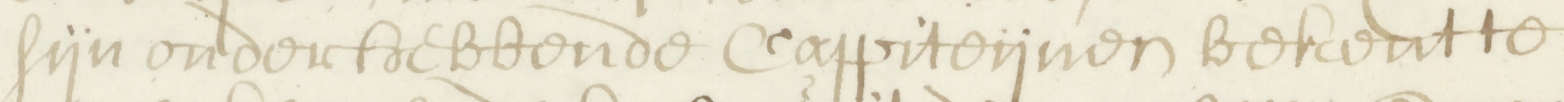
sijn onderhebbende Cappiteijnen bekent te
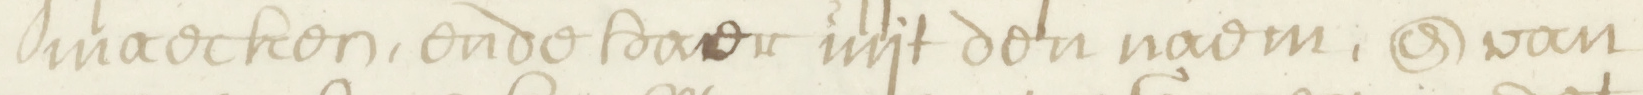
maecken, ende haer uijt den naem: & van
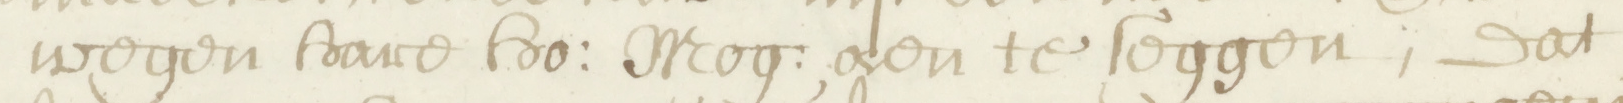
wegen hare ho:Mog: aen te seggen; Dat
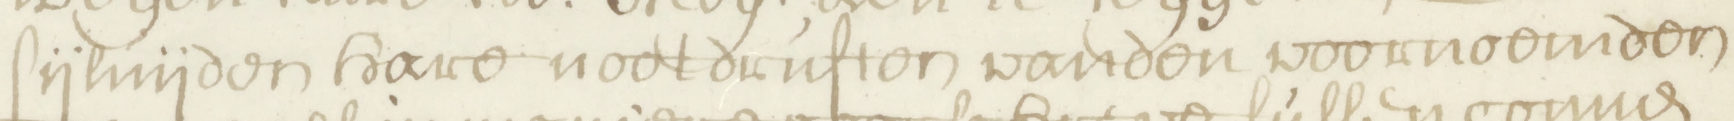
sijluijden hare nootdruften vanden voornoemden
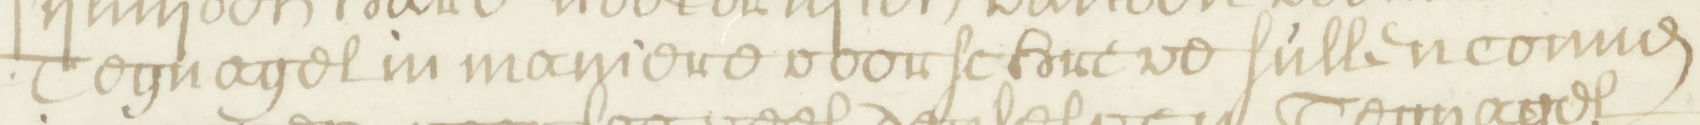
Tegnagel in maniere voorschreve sullen connen
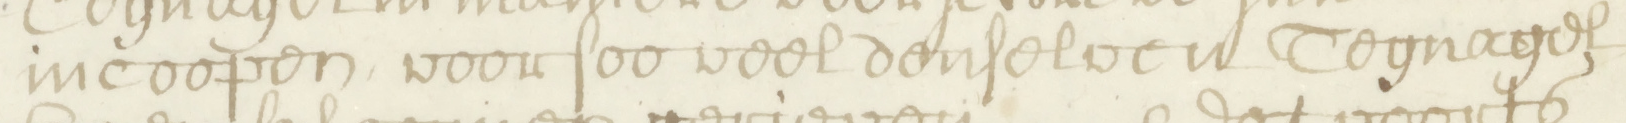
incoopen, voor soo veel denselven Tegnagel
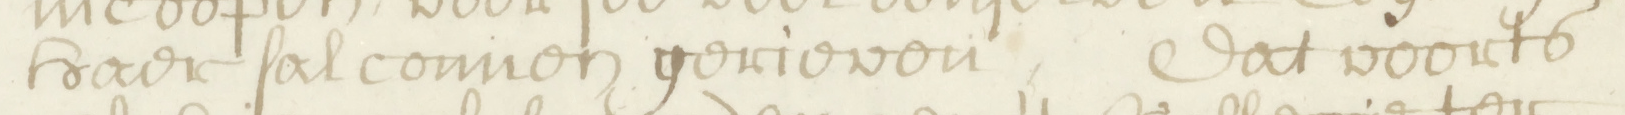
haer sal connen gerieven; Dat voorts
